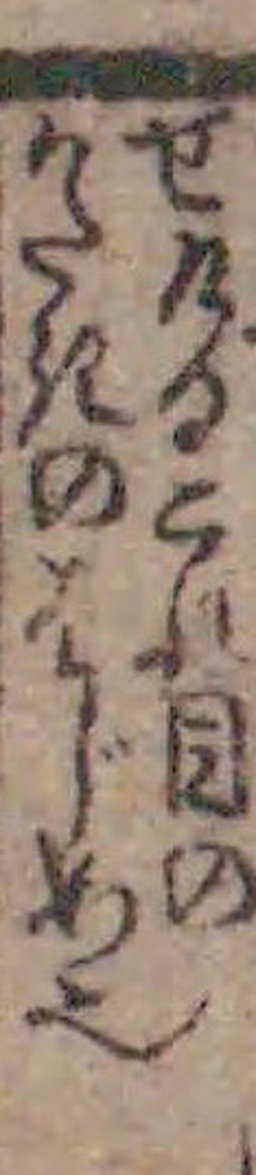かたきのはじめ也

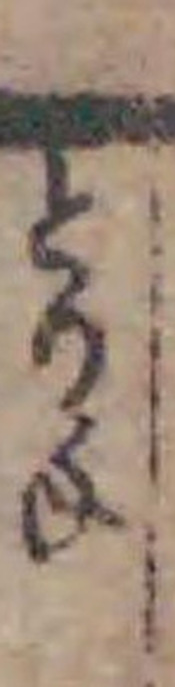とり手
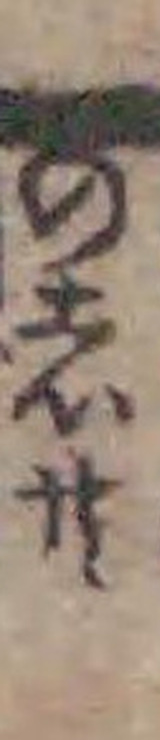の者共
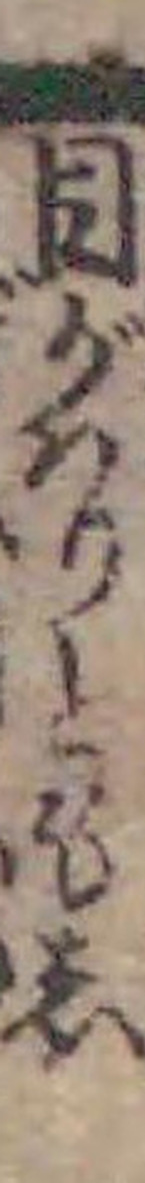目がはりともし
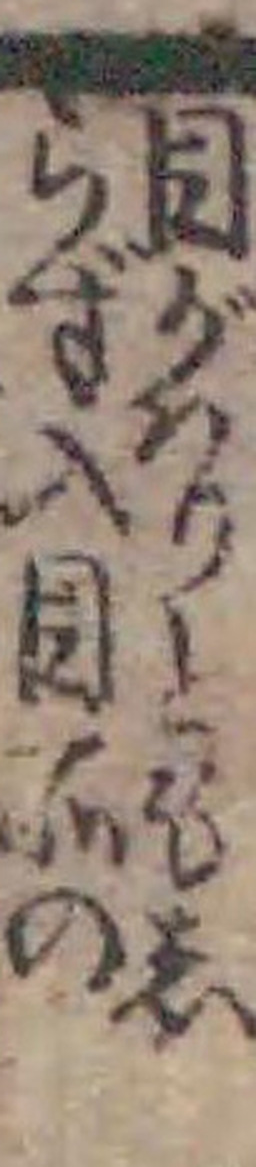らず入目所の
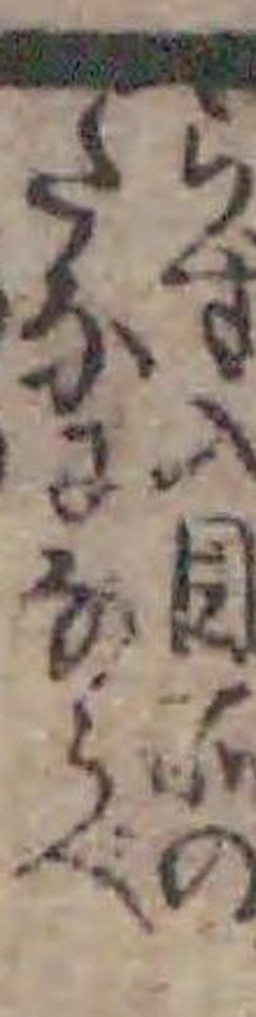たなにならべ
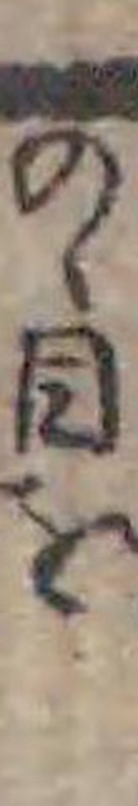のゝ目を
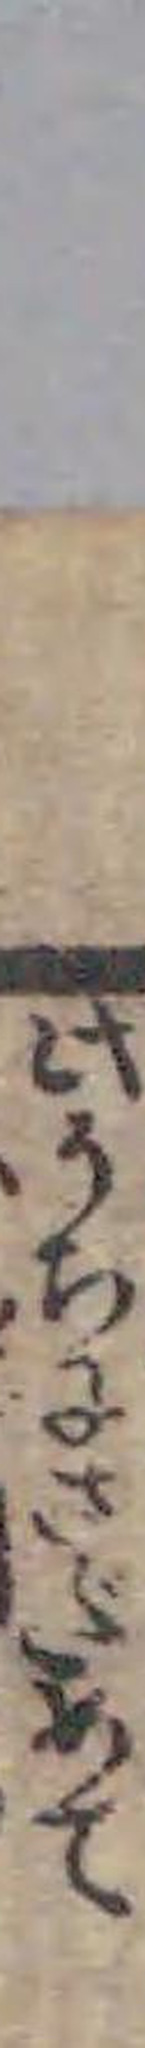此うちにさだめて
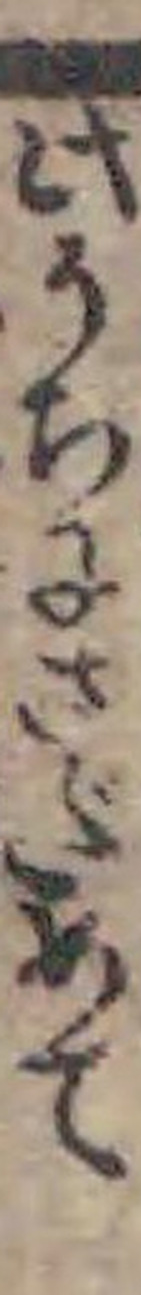此うちにさだめて
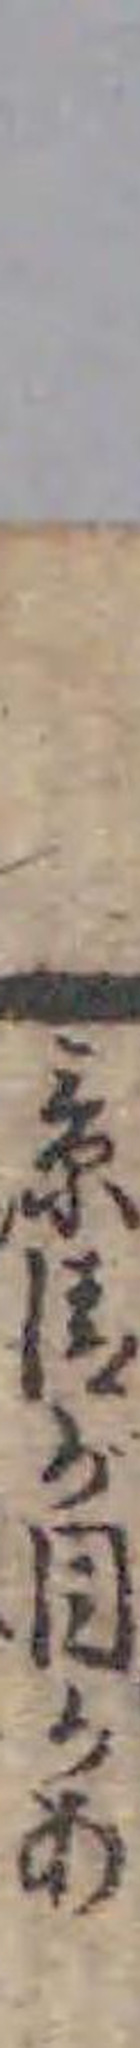景清が目かあ
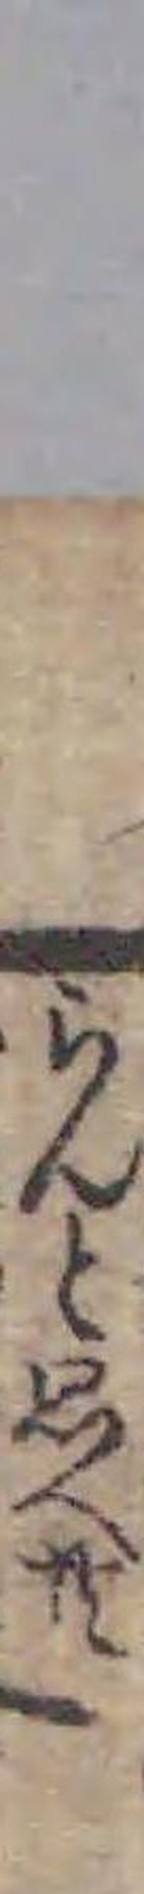らんと思へ共
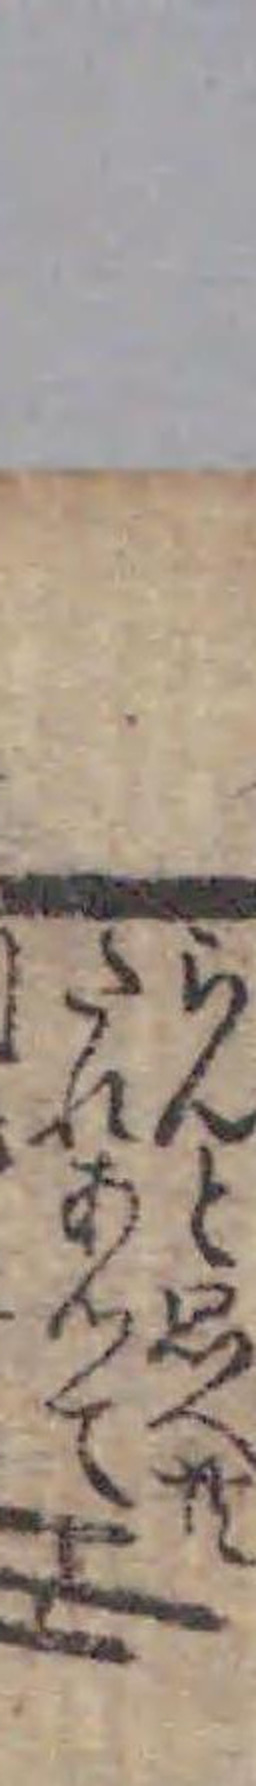たれあつて
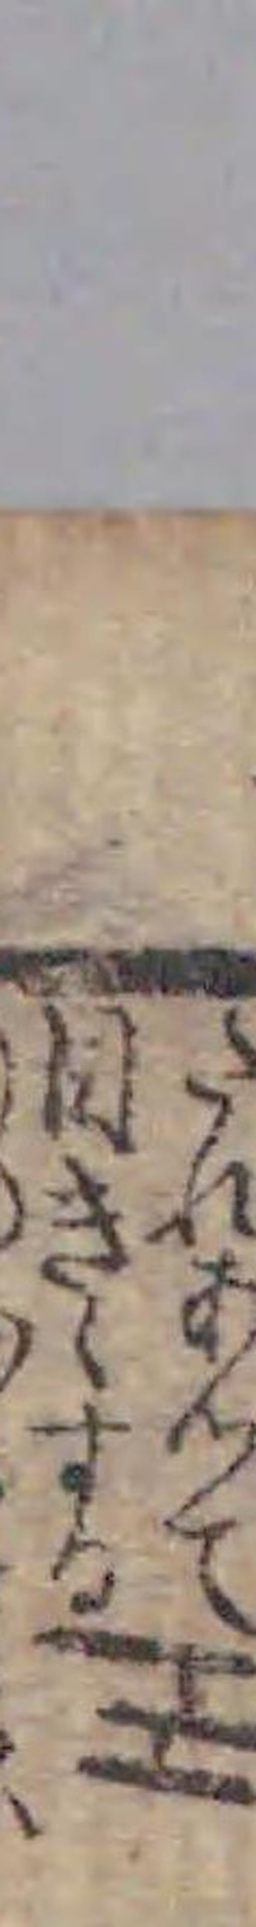目きゝする
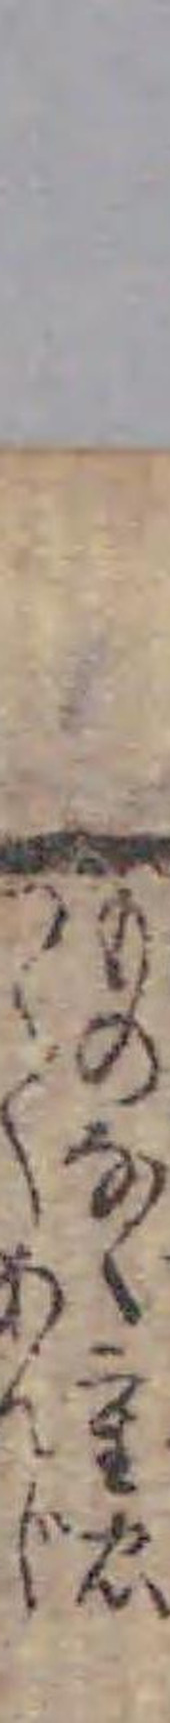ものなく重忠
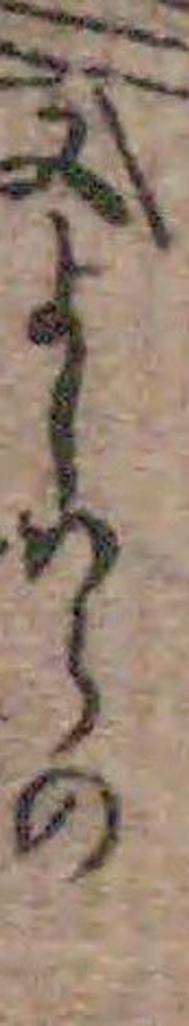〽又よしはらの
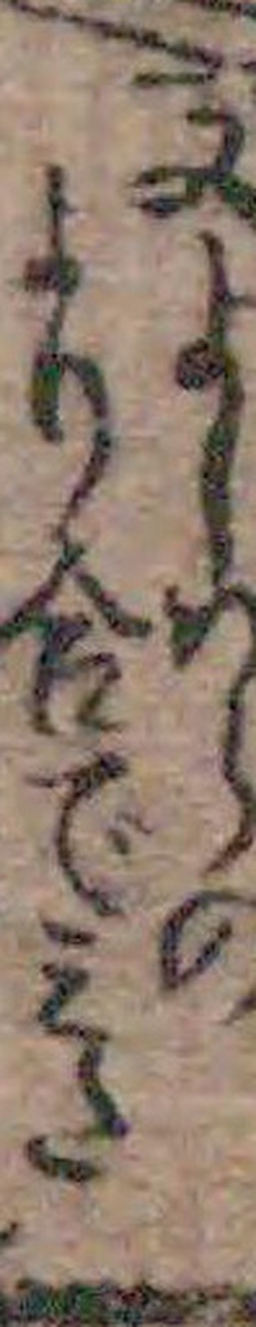より合でみた
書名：悪七変目景清 : 2巻
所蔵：国立国会図書館 National Diet Library, JAPAN
